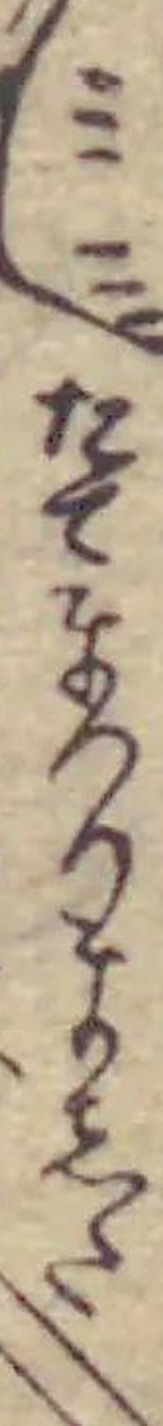たてまつりました
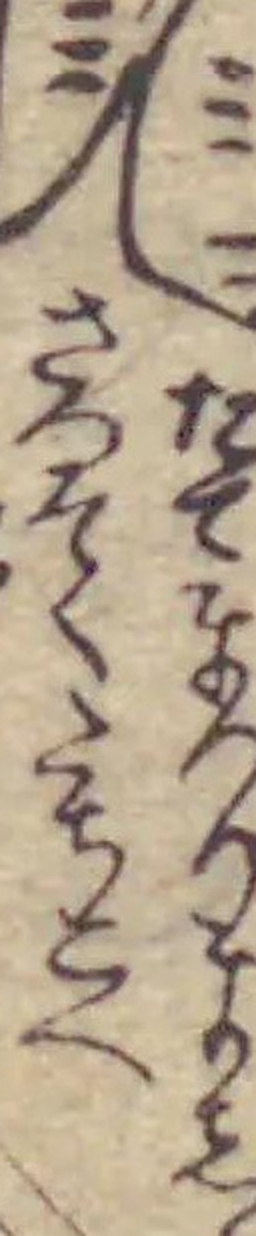さつそくたちこへ
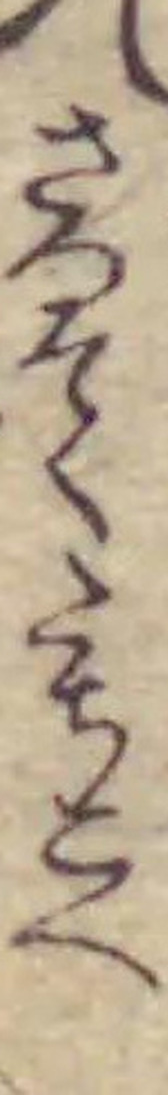さつそくたちこへ
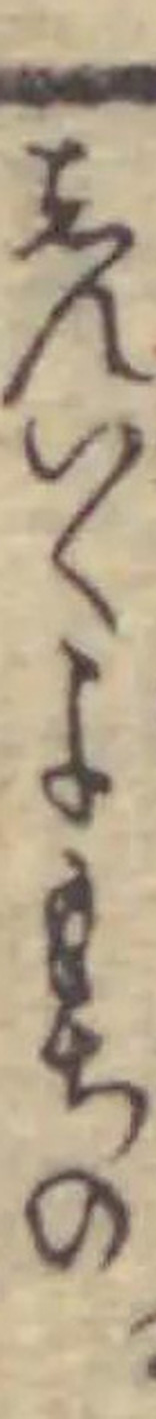しんいくよもちの
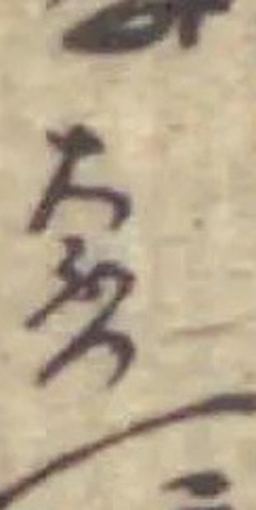大ふつ
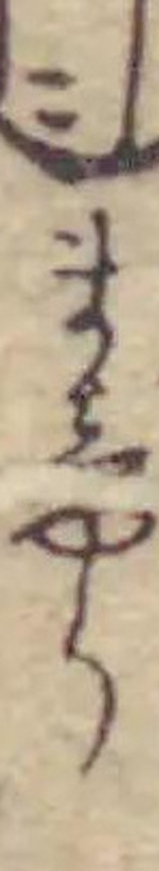ましやう
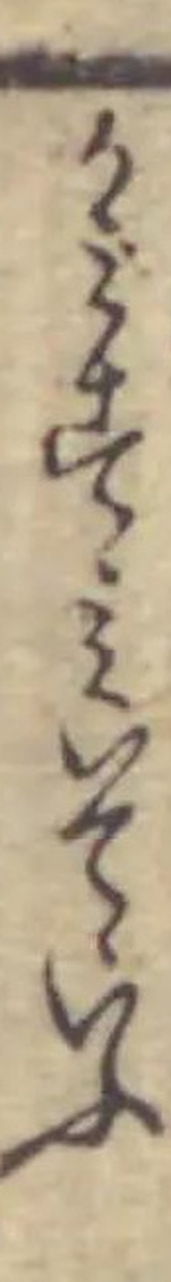かみすゝみいてゝいふ
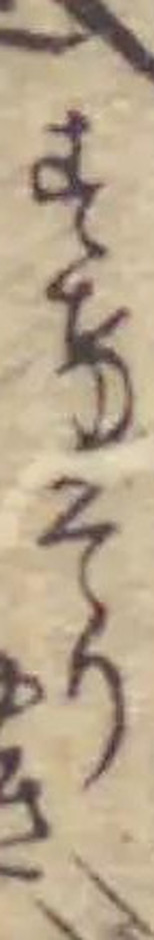すけそう
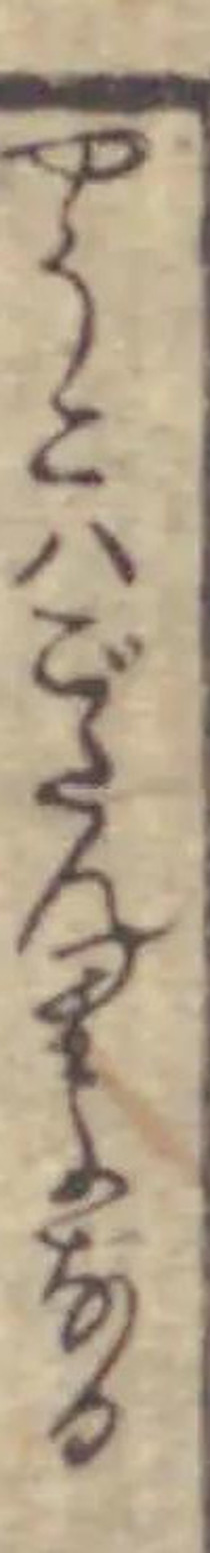やうこはごたんりよなる
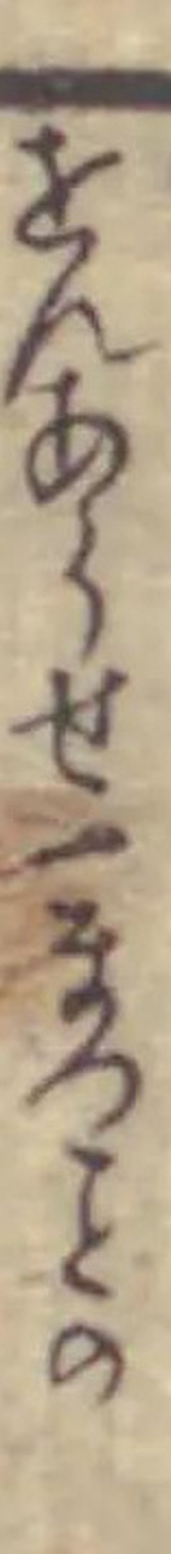をんあらせ一まつことの
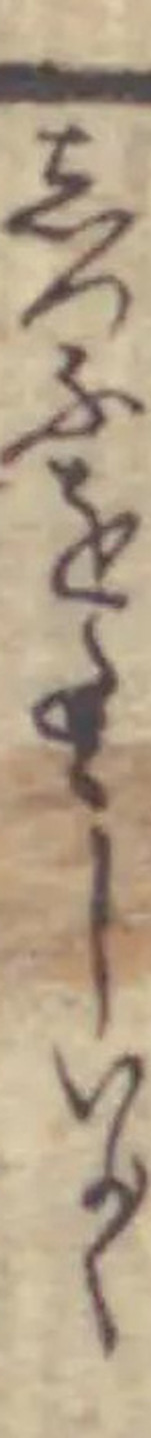しつふをしいよ〳〵
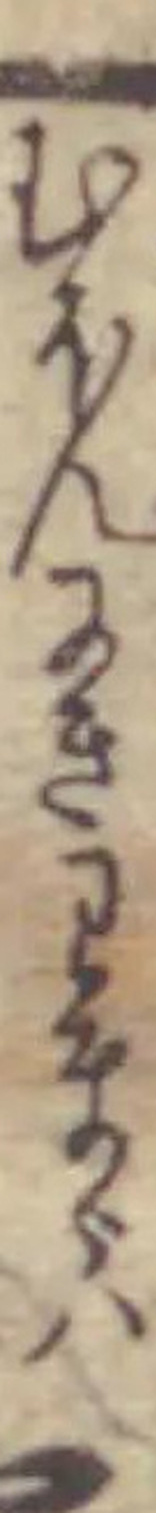むほんにきわまらは
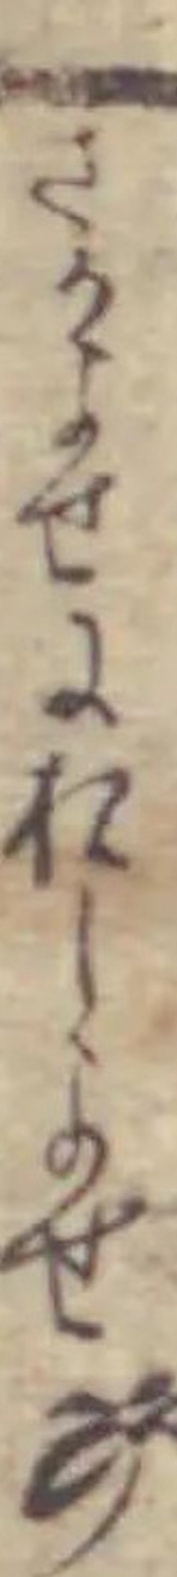さかよせにおしよせ
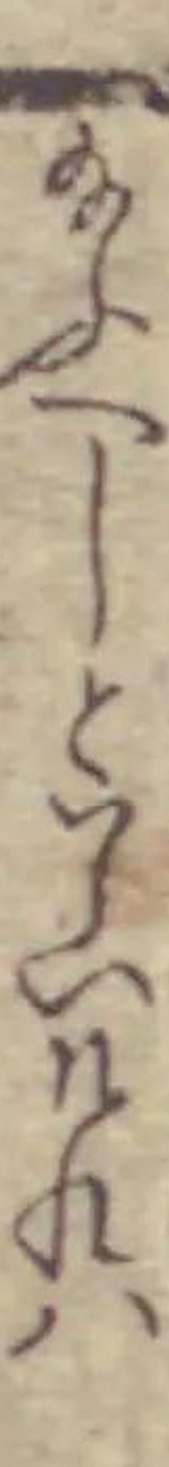給ふへしといいけれは
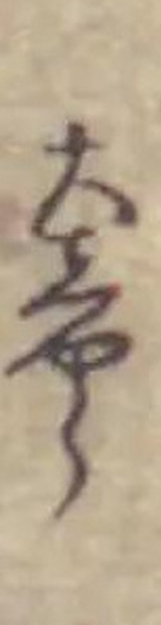ましやう
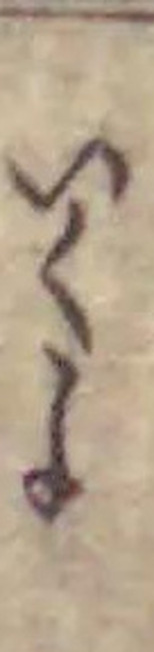いくよ
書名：餅酒腹中能同志 2巻
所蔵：国立国会図書館 National Diet Library, JAPAN
